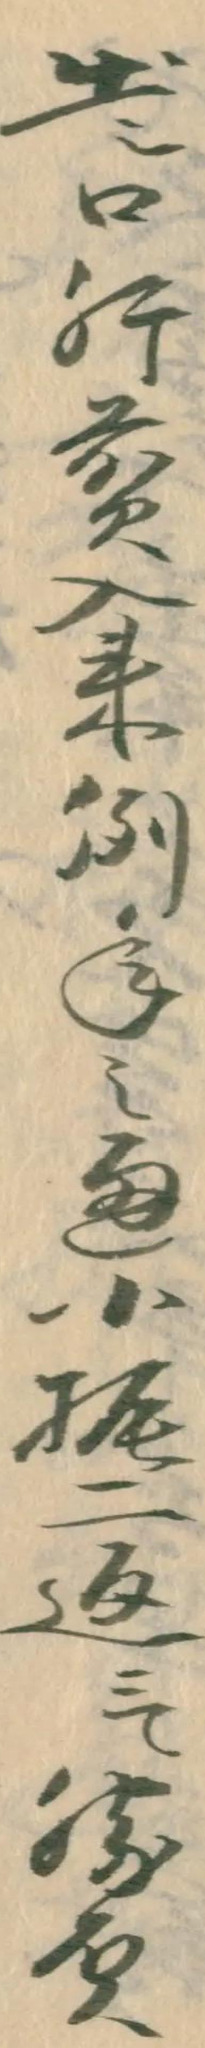出シ口肝煎入来例年之通小振二返ニて勝負
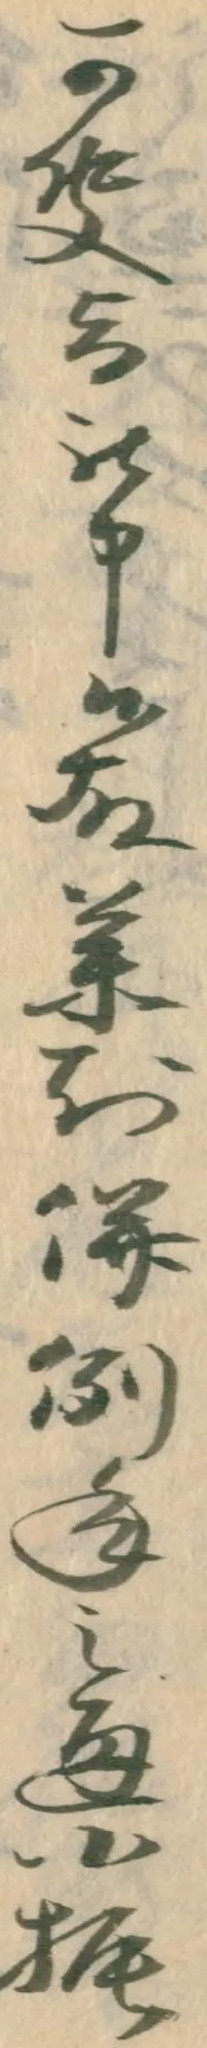可決旨被申候故承知併例年之通小振
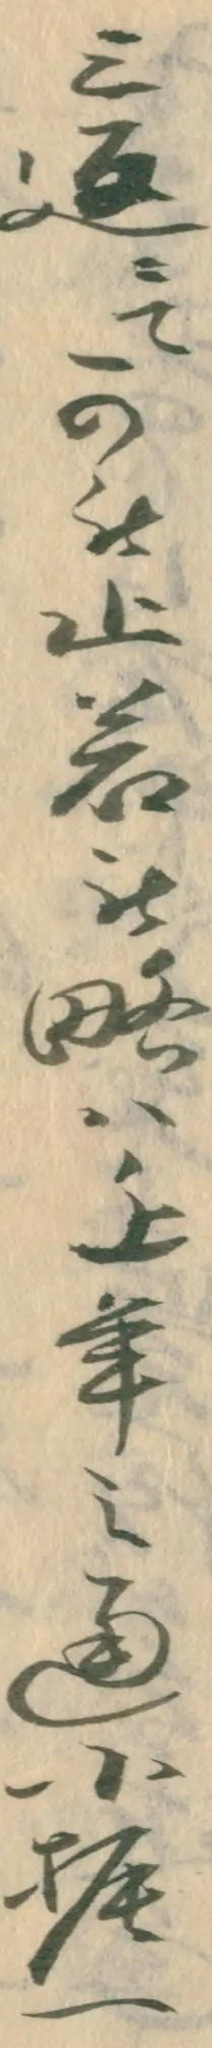三返ニて可被止若被略ハ上年之通小振一
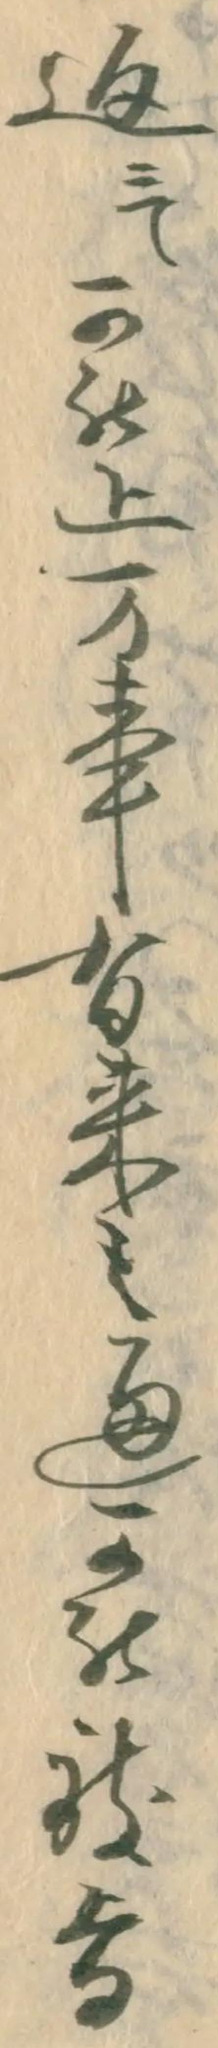返ニて可被上万事有来之通可被致旨

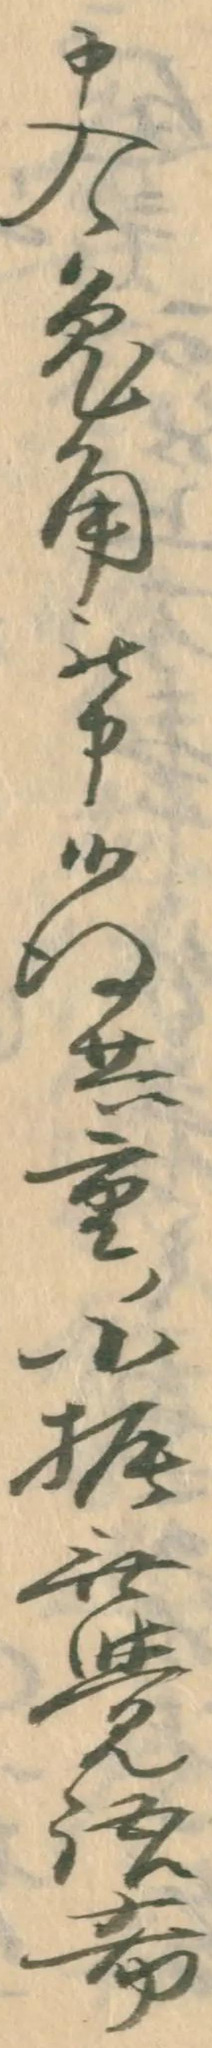申入候兎角被申候得共重ノ小振無覚語希
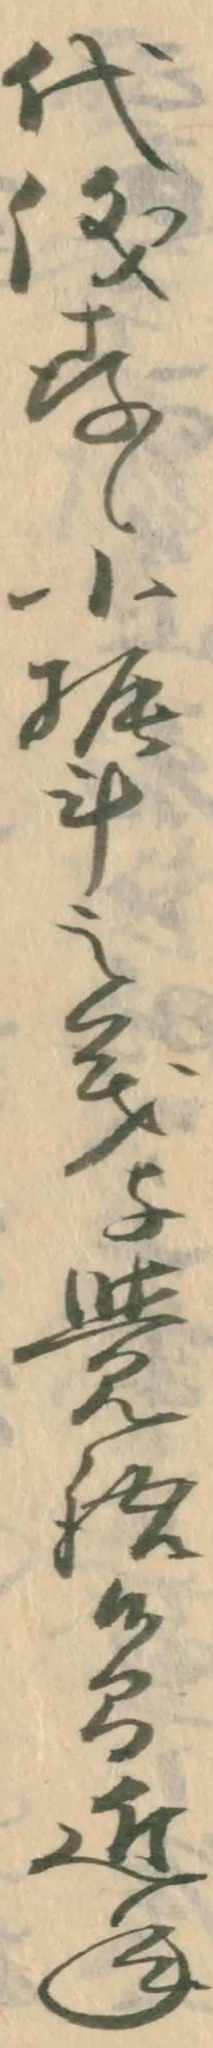代儀存候小振計之義と覚悟候間近年
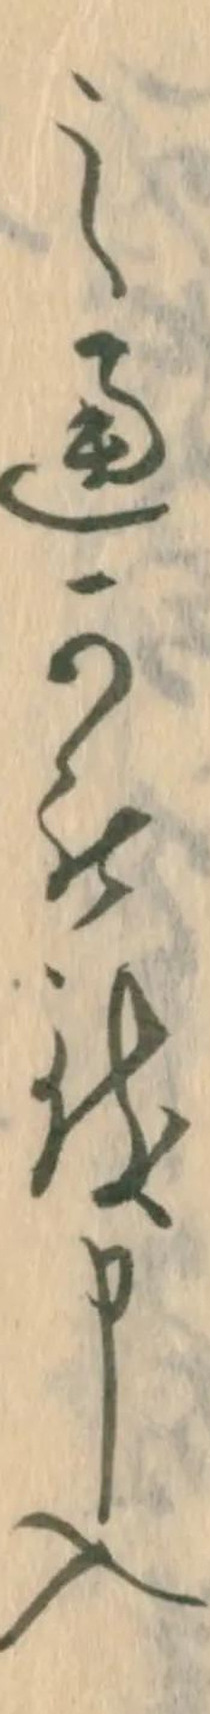之通可被致申入
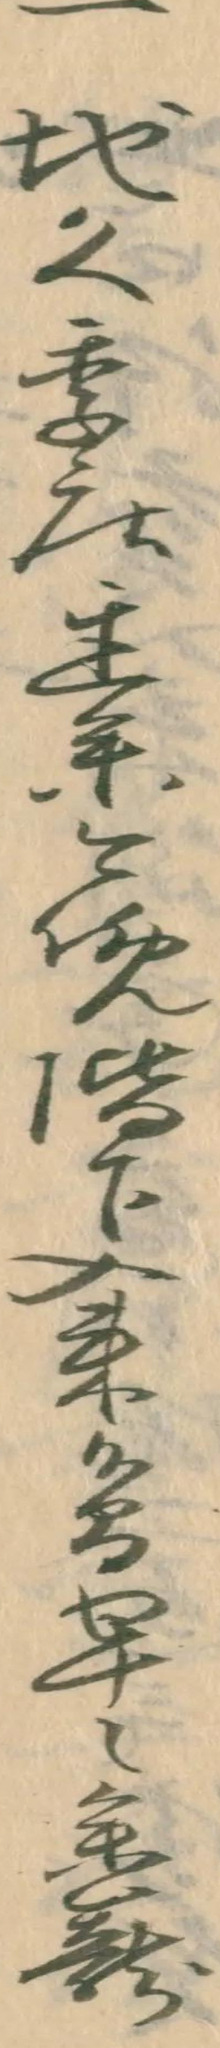一地久季庄遅参今晩階下入来候間早々参籠
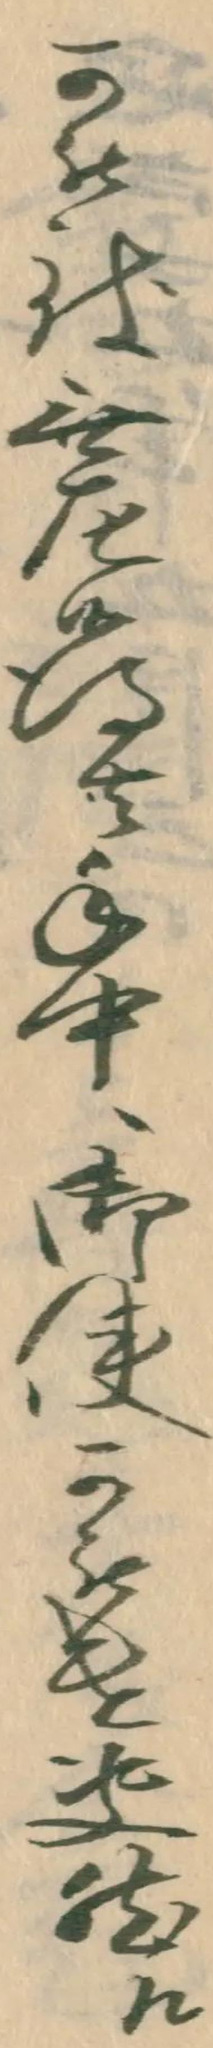可被致無左候得者手中へ御使可被遣決然ル
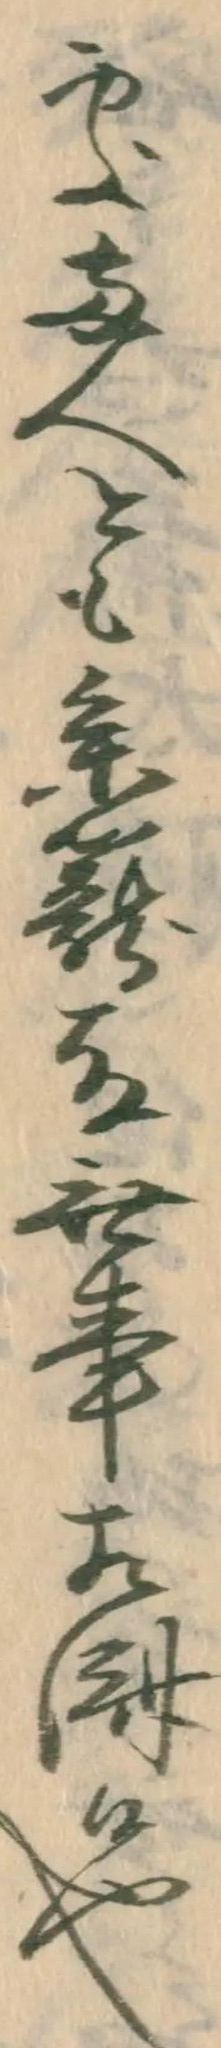処両人とも参籠故無事相済候也
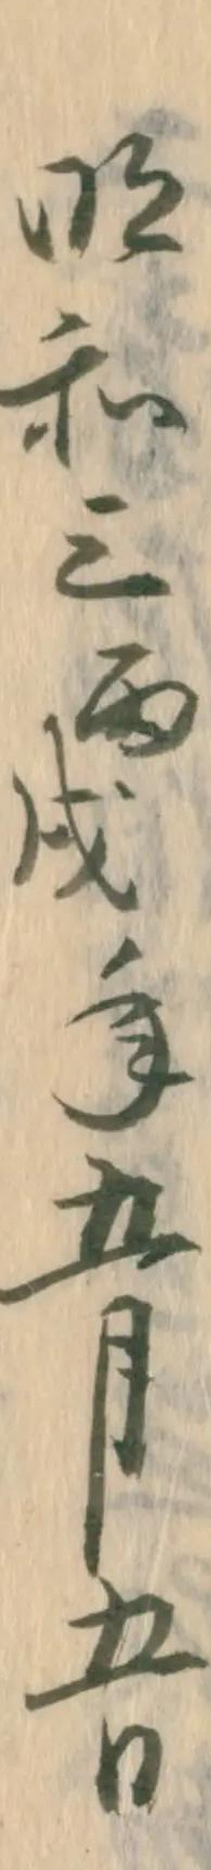一明和三丙戌年五月五日
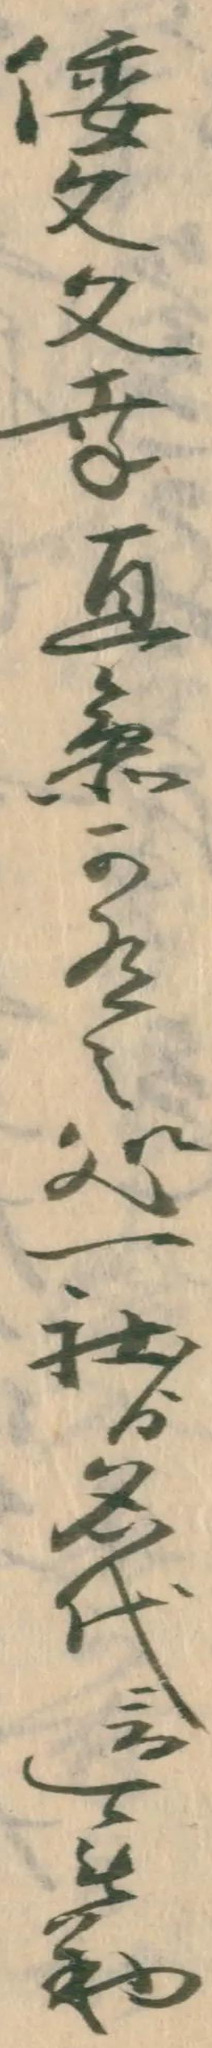倭文久幸直参可有之処一社ゟ名代ニ而可被勤
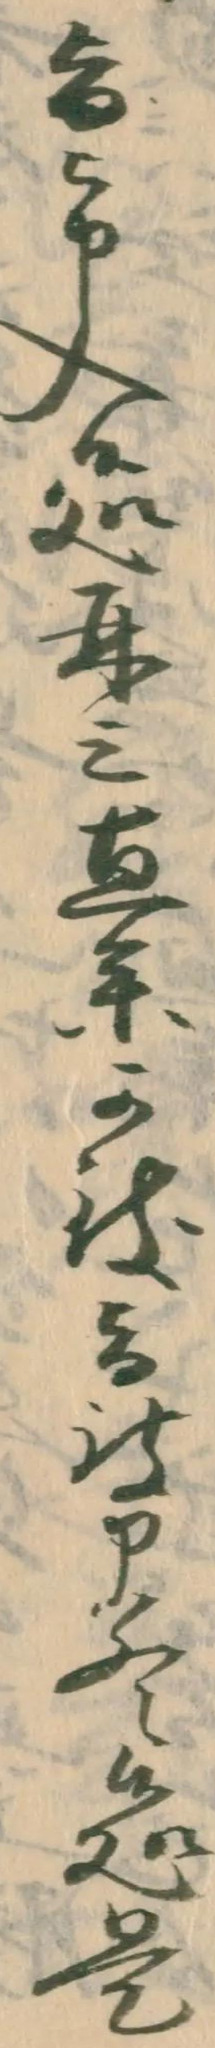旨被申入候処再三直参可致旨被申答候処是
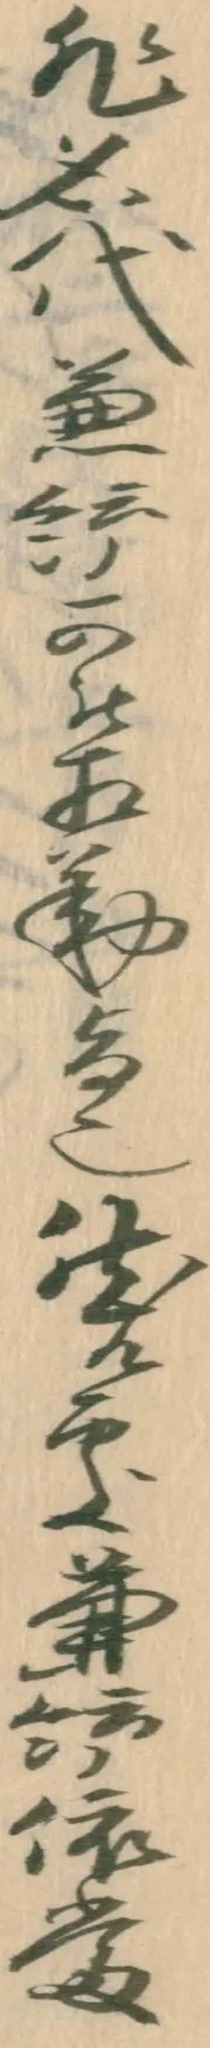非名代兼統可被相勤旨也然ル処兼統依当
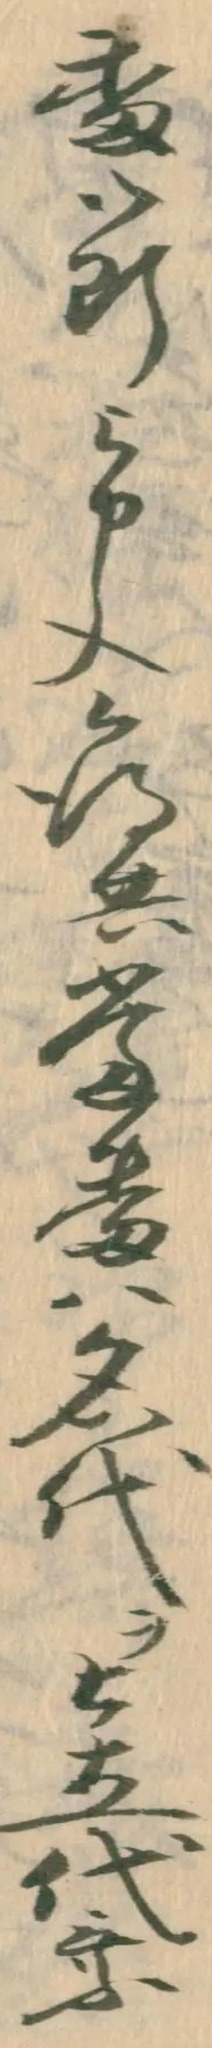番御断被申入候得共当番ハ名代ヲ被立代乗
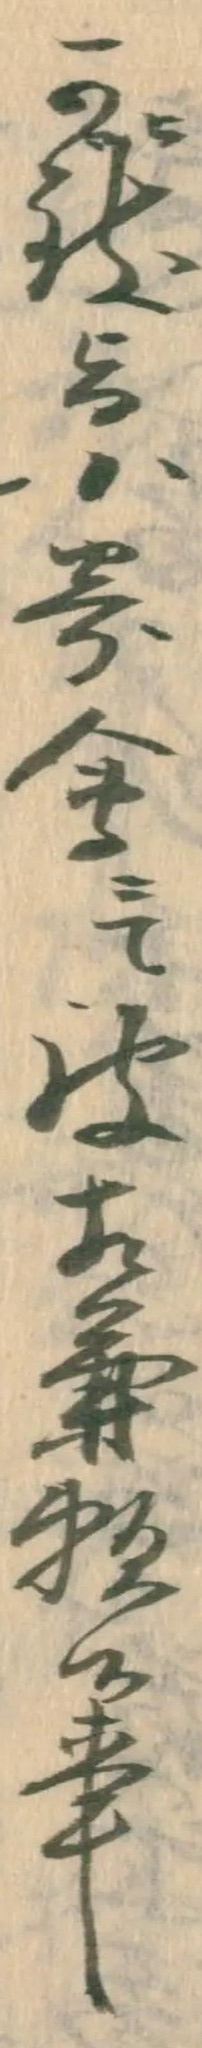可被致旨小寄会ニて被相兼頼候事
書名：賀茂社記録. 第12冊
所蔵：国立国会図書館 National Diet Library, JAPAN
